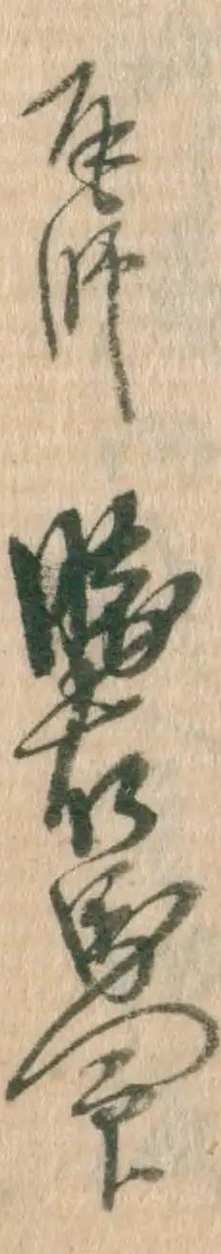瓦師勝右衛門印
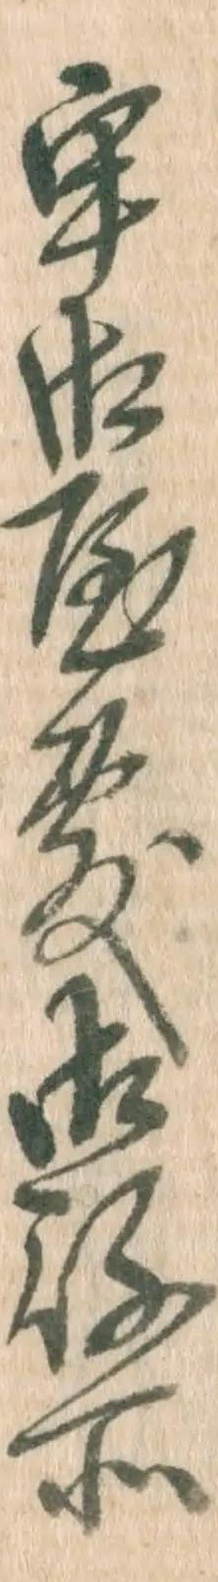牢御屋敷御役所
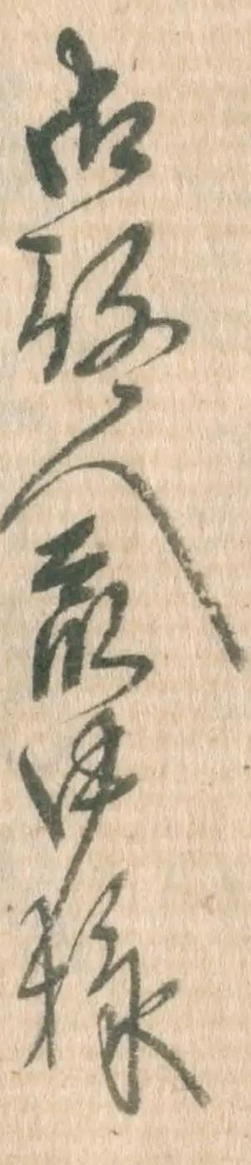御役人衆中様

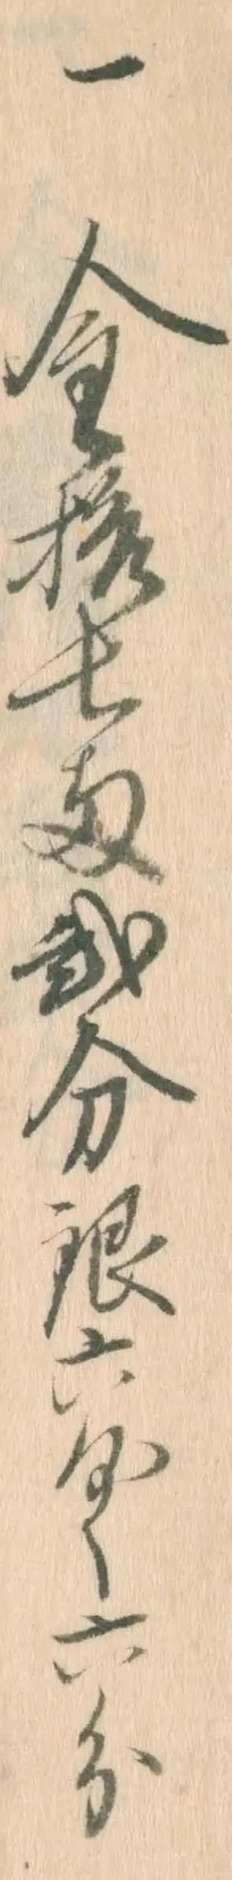金拾七両弐分銀六匁六分
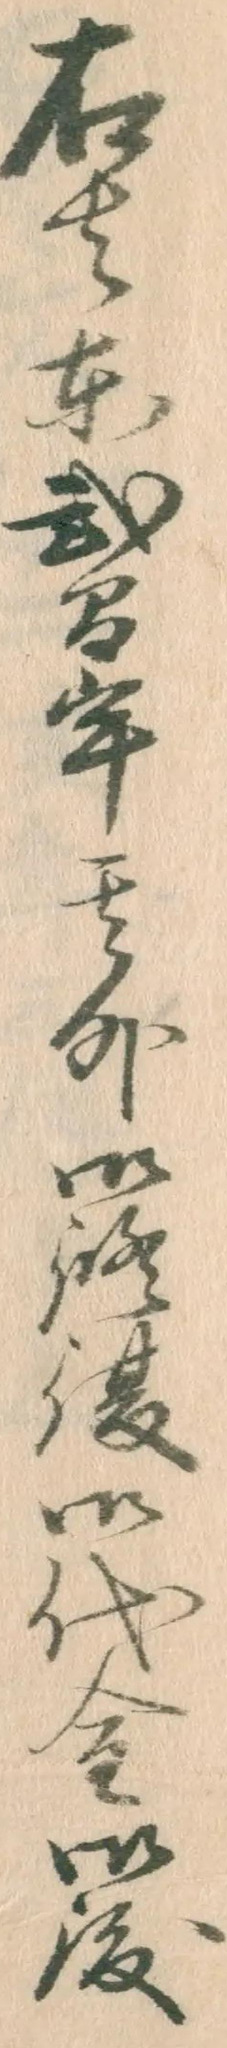右は東弐間牢其外御修復御代金御渡
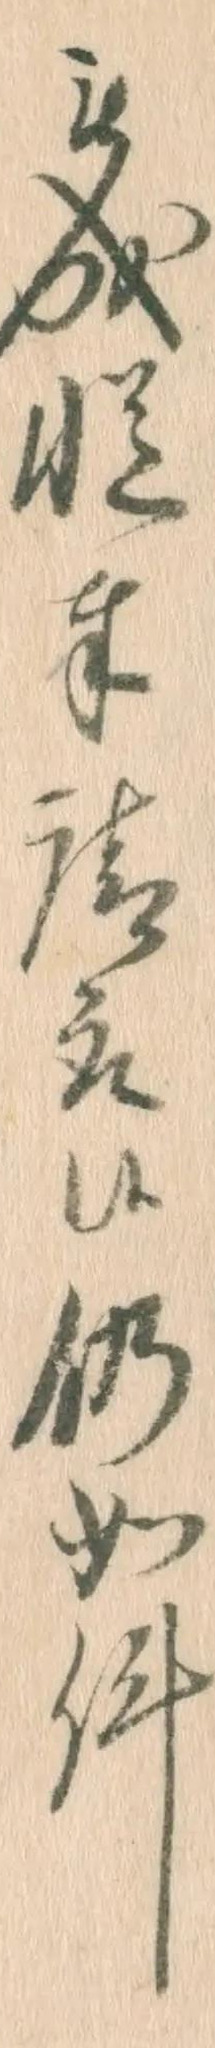被成慥奉請取候仍如件
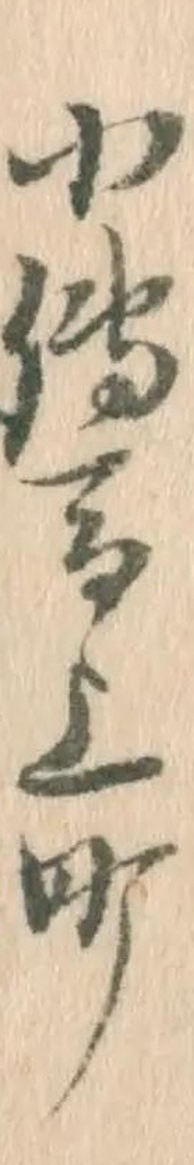小伝馬上町
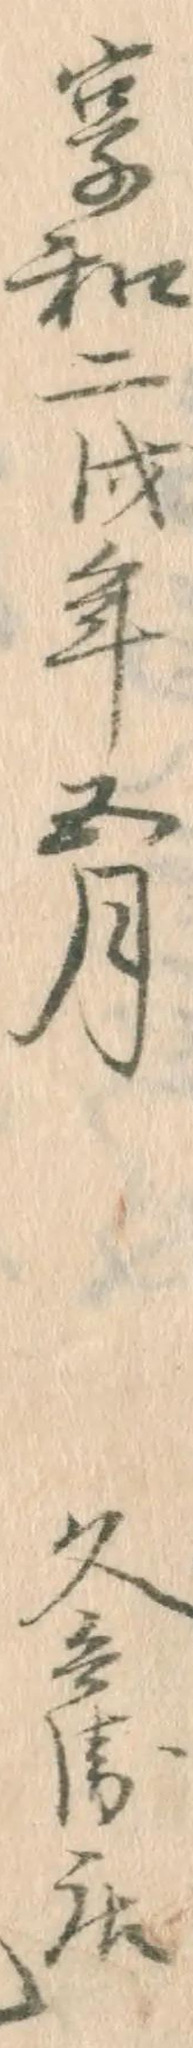享和二戌年五月久兵衛店
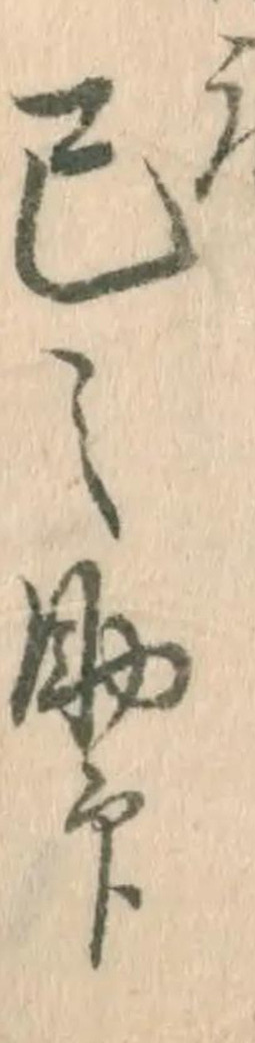巳之助印
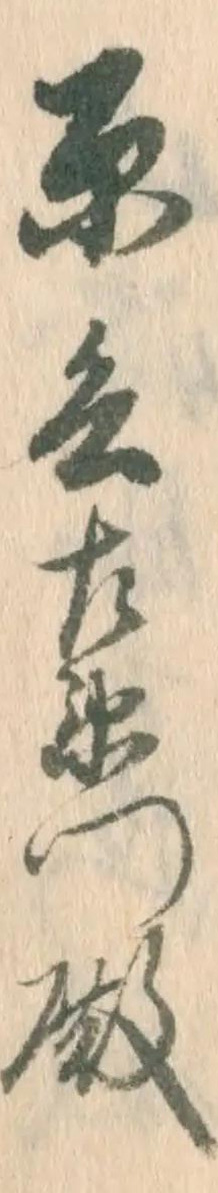原兵左衛門殿

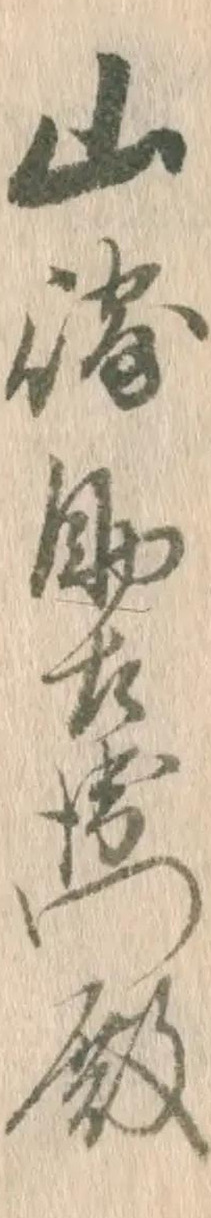山崎助左衛門殿
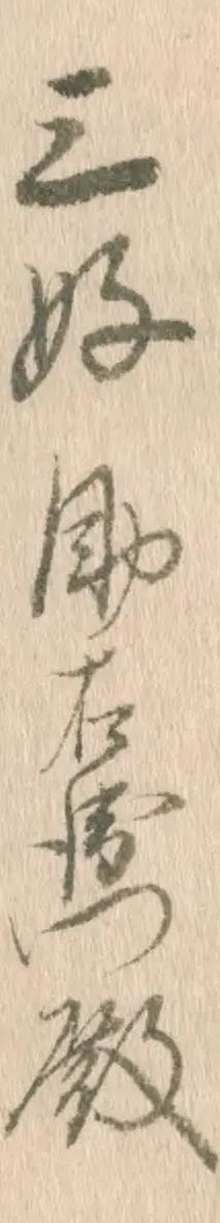三好助右衛門殿
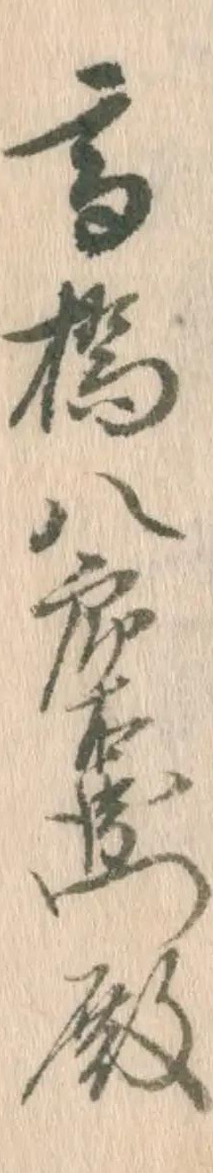高橋八郎右衛門殿
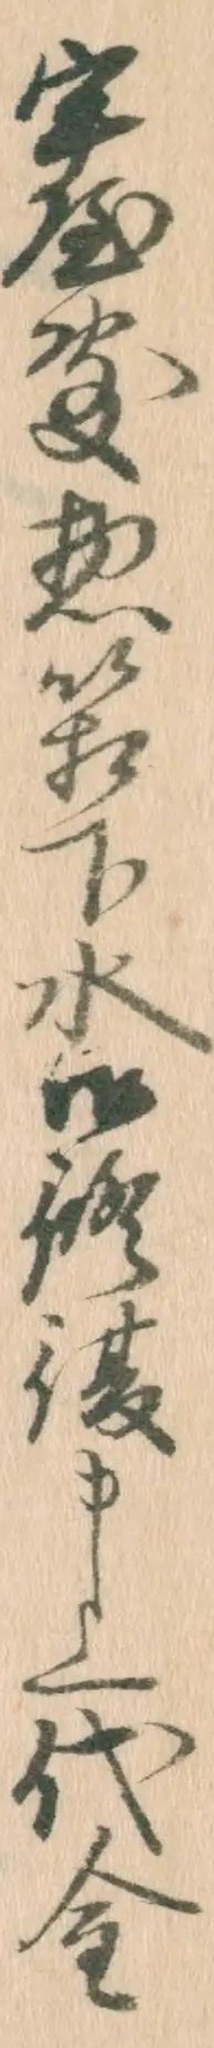牢屋敷惣箱下水御修復申上代金
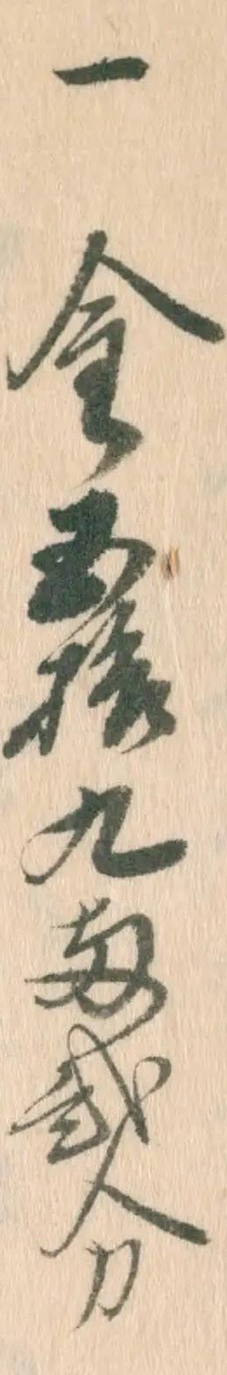一金五拾九両弐分
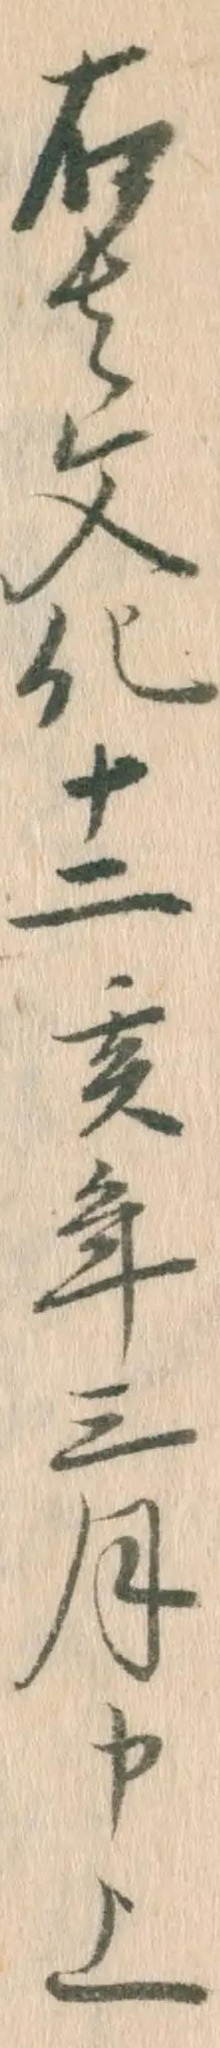右は文化十二亥年三月申上
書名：七十冊物類集 71巻. [44] 四十三 牢屋敷御普請御修覆地震ニ付骨折候牢屋掛御褒美之部
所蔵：国立国会図書館 National Diet Library, JAPAN
